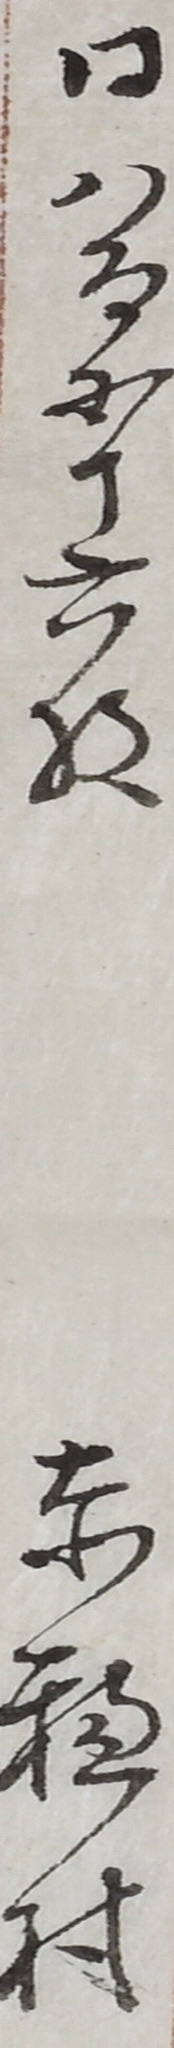同八百五十六枚赤穂村
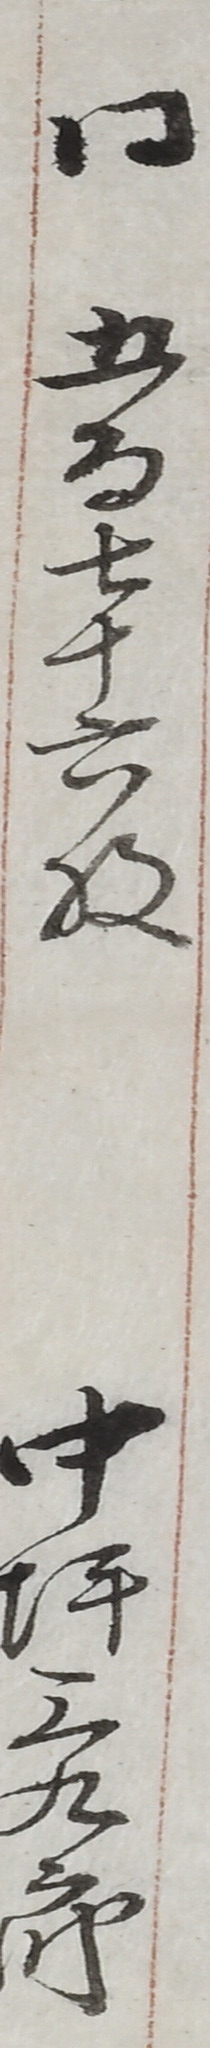一同五百七十六枚中坪三九郎

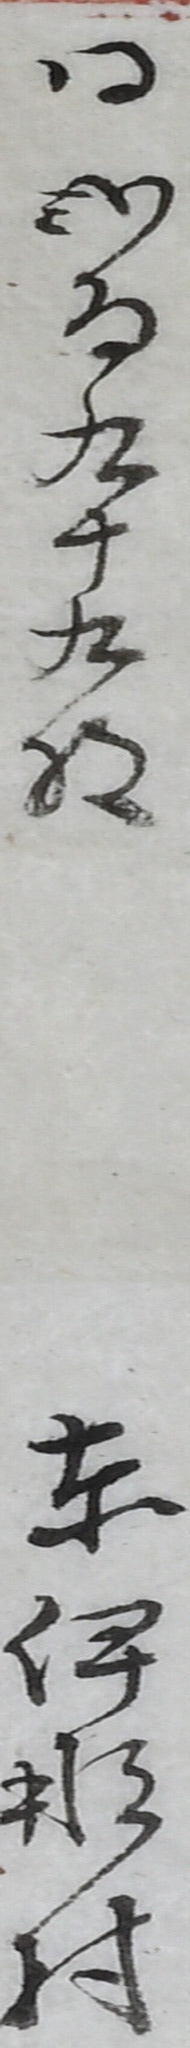同弐百九十九枚東伊那村
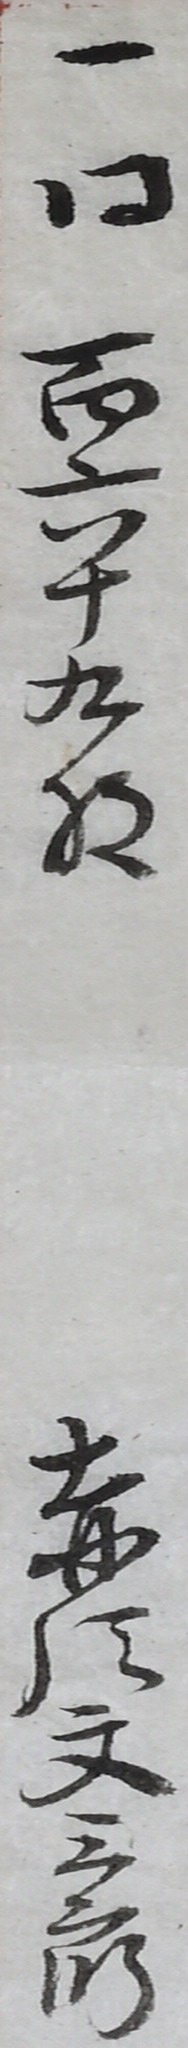一同百六十九枚赤須文三郎
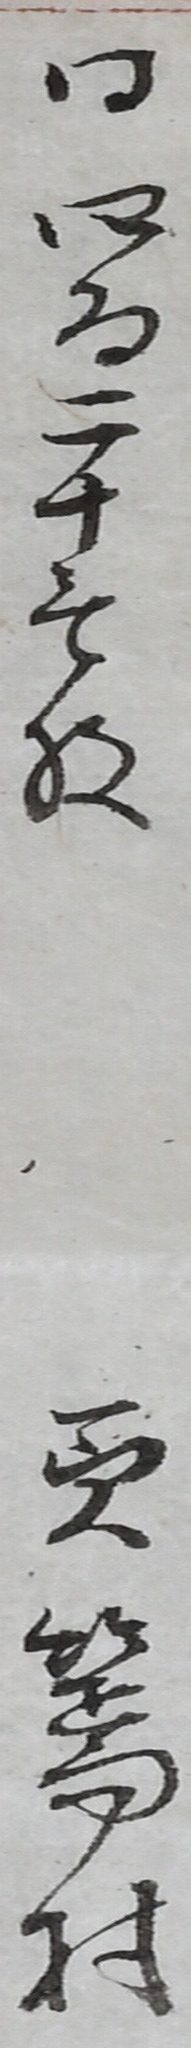同四百二十壱枚美篤村
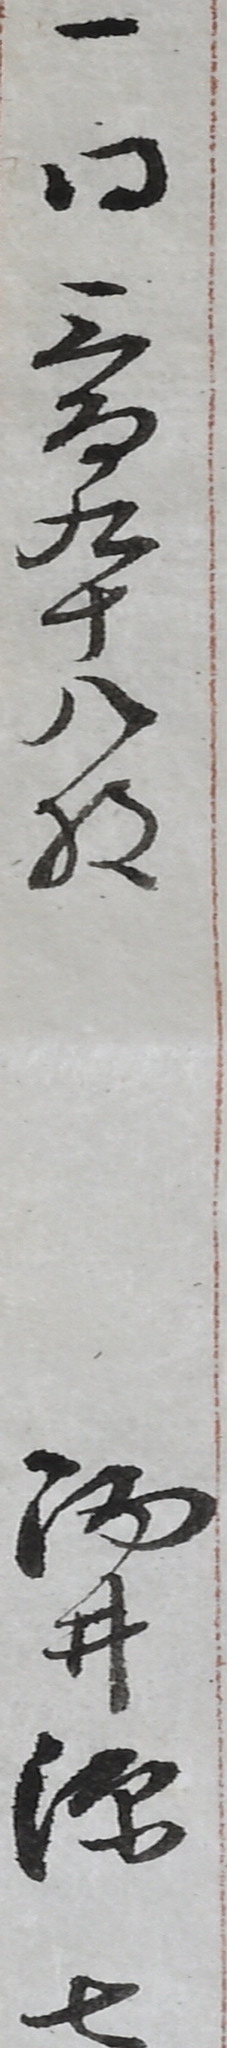一同三百九十八枚酒井源七
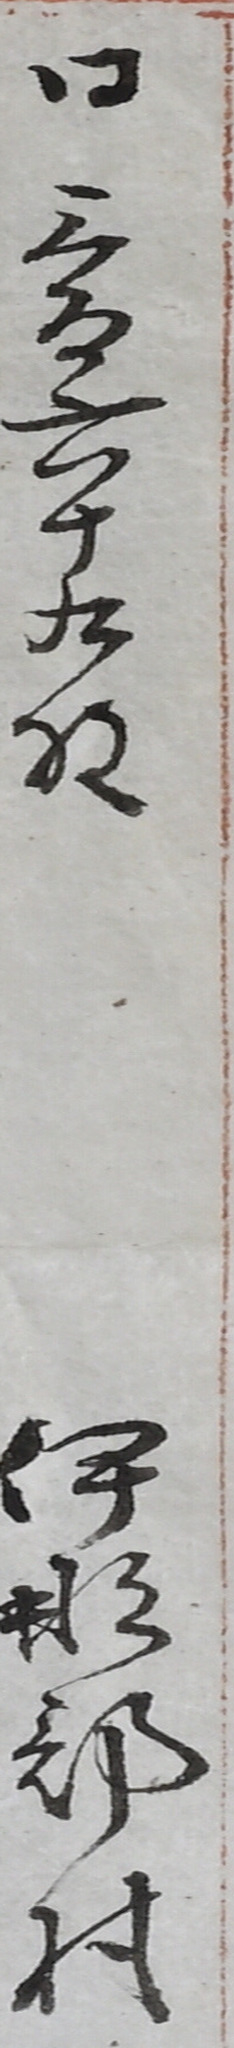同三百六十九枚伊那部村
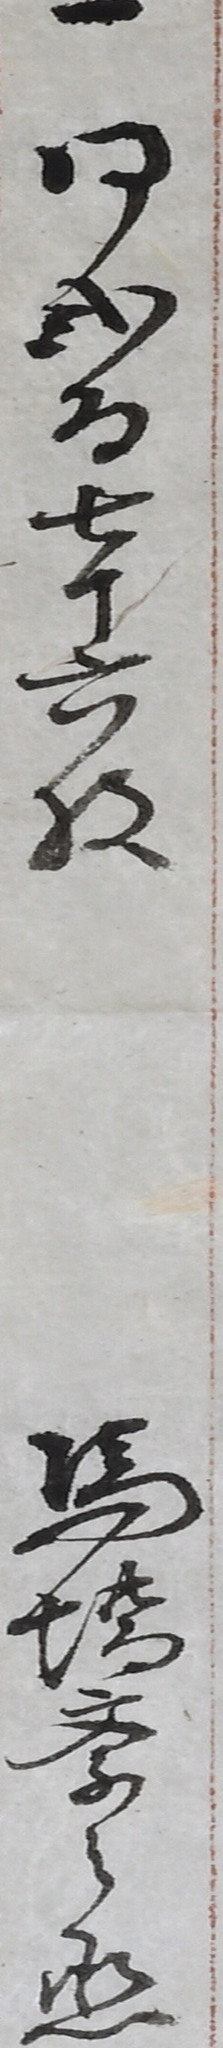一同弐百七十六枚馬場斎之丞
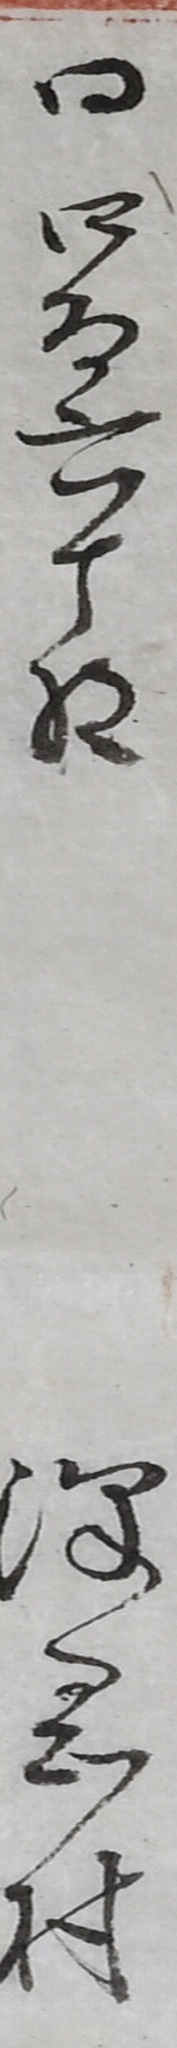同四百六十程沢岡村
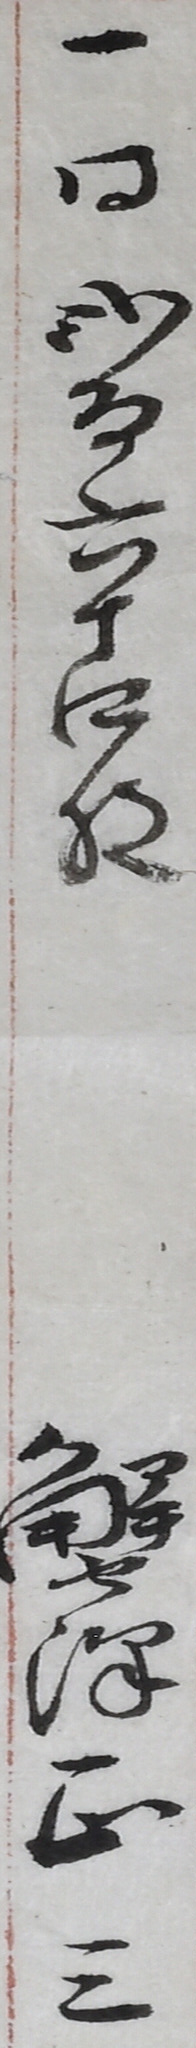一同弐百六十四枚蟹澤正三
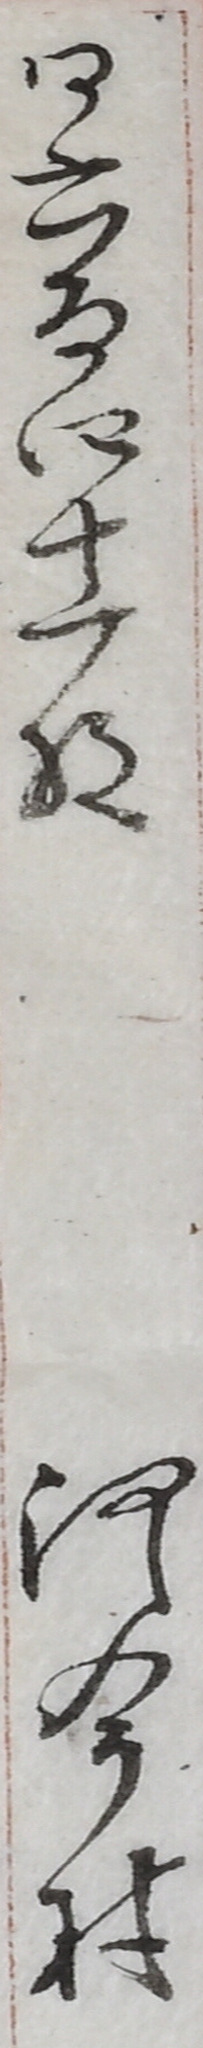同六百四十一枚河合村
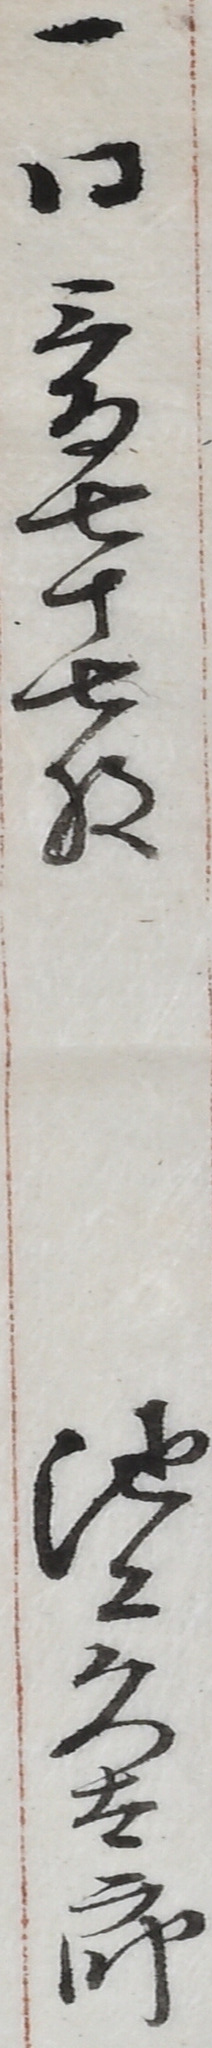一同三百七十七枚池上久太郎
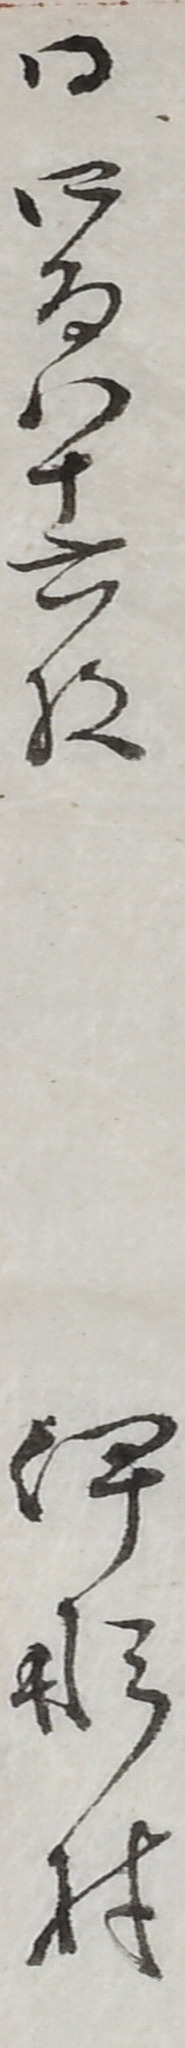同四百八十六枚伊那村
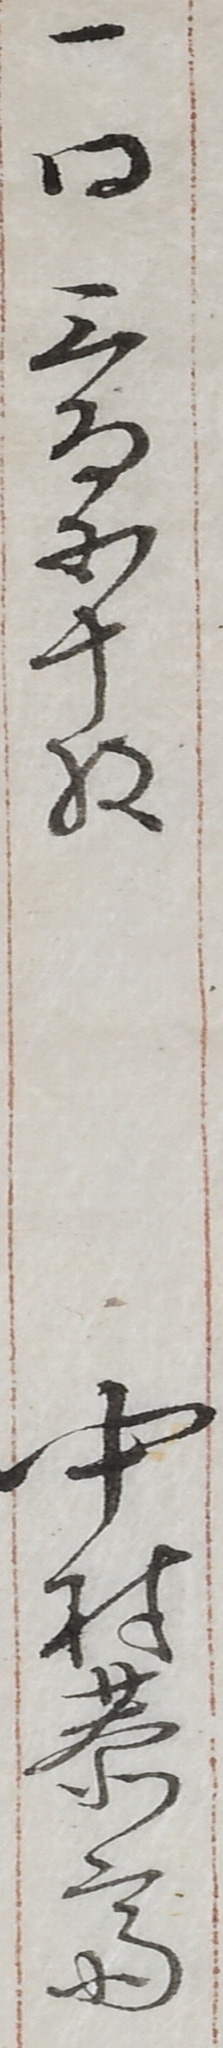一同三百五十枚中村恭衛
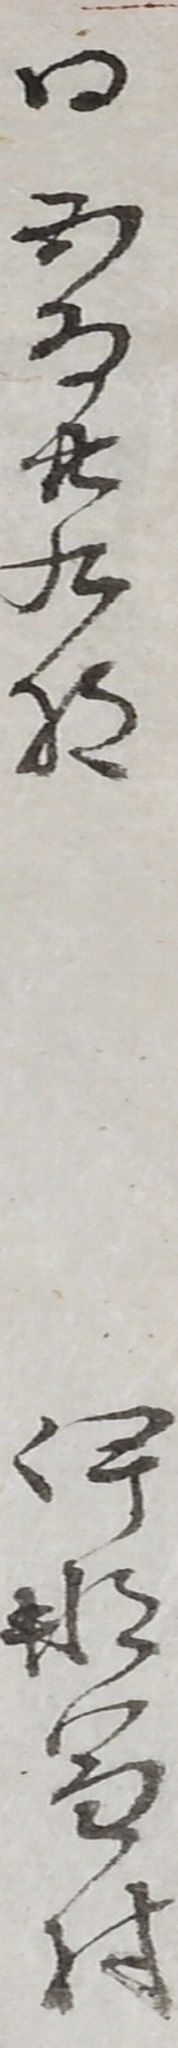同五百廿九枚伊那冨村
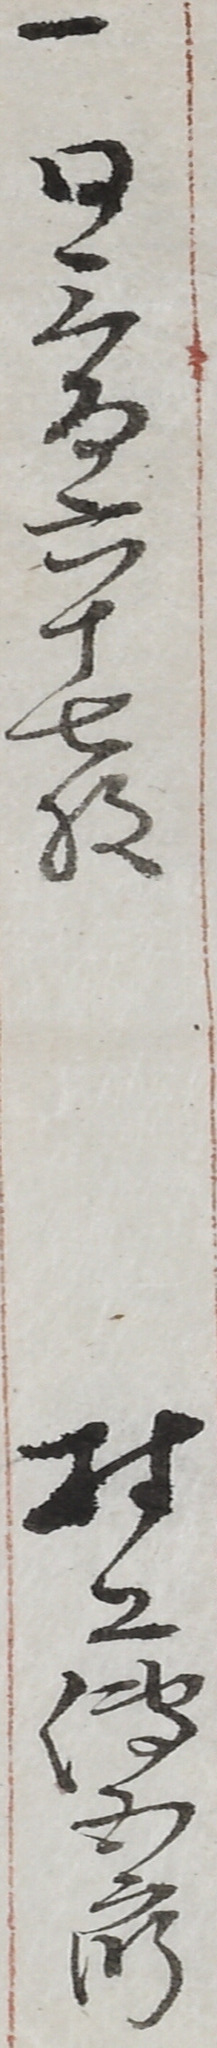一同三百六十七枚村上伝五郎
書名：郡役所勤務中御用抜書
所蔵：伊那市立高遠町図書館・合同会社AMANE
